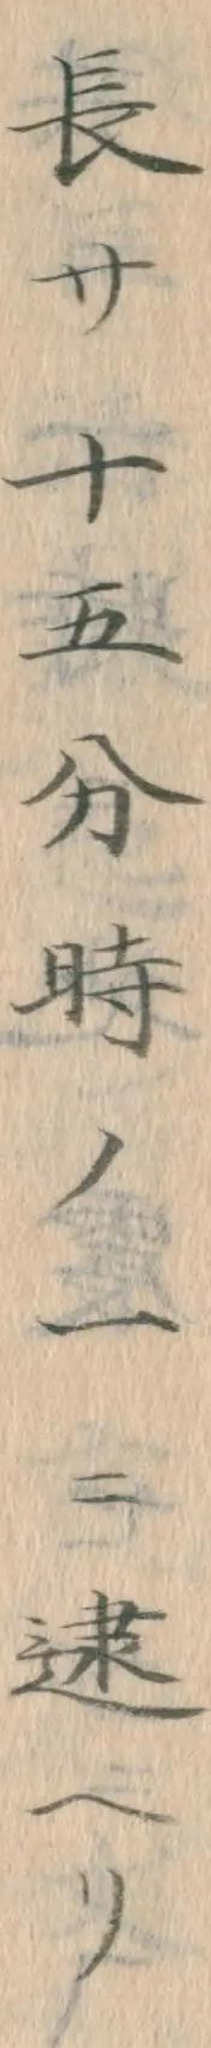長サ十五分時ノ一ニ逮ヘリ
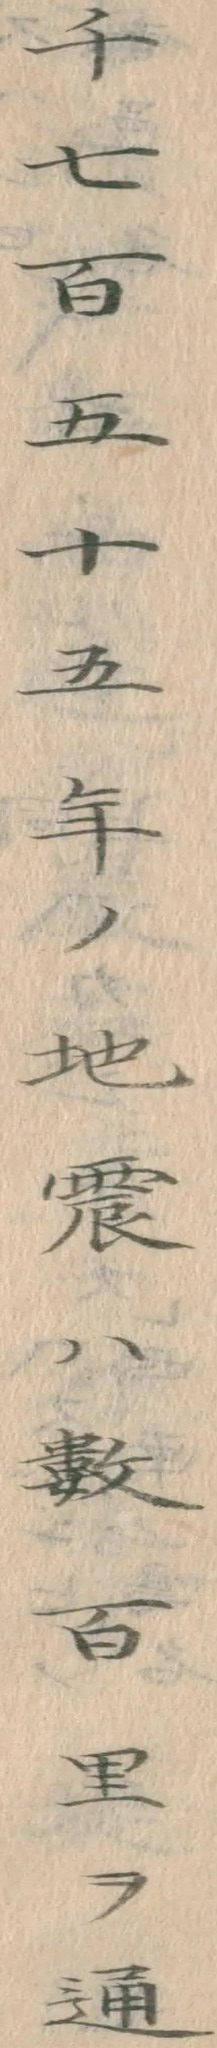千七百五十五年ノ地震ハ数百里ヲ通
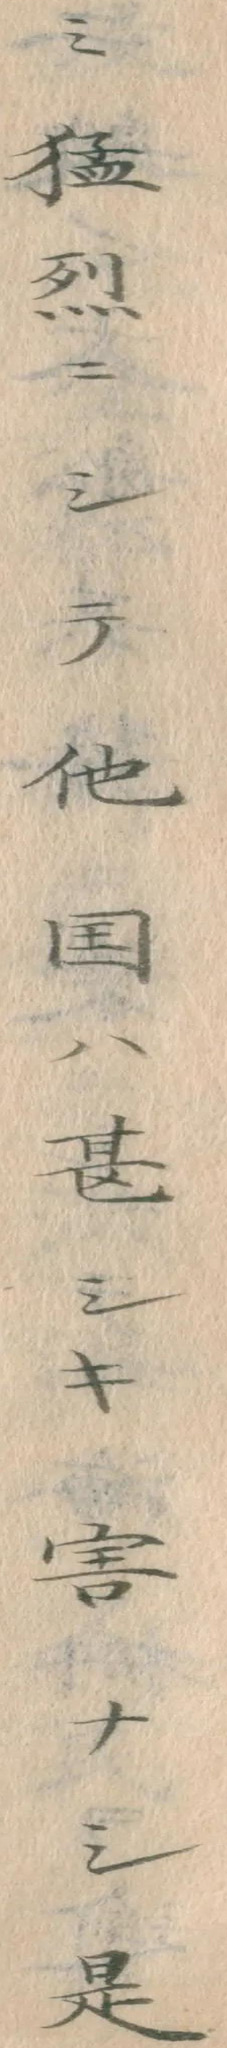ミ猛烈ニシテ他国ハ甚シキ害ナシ是
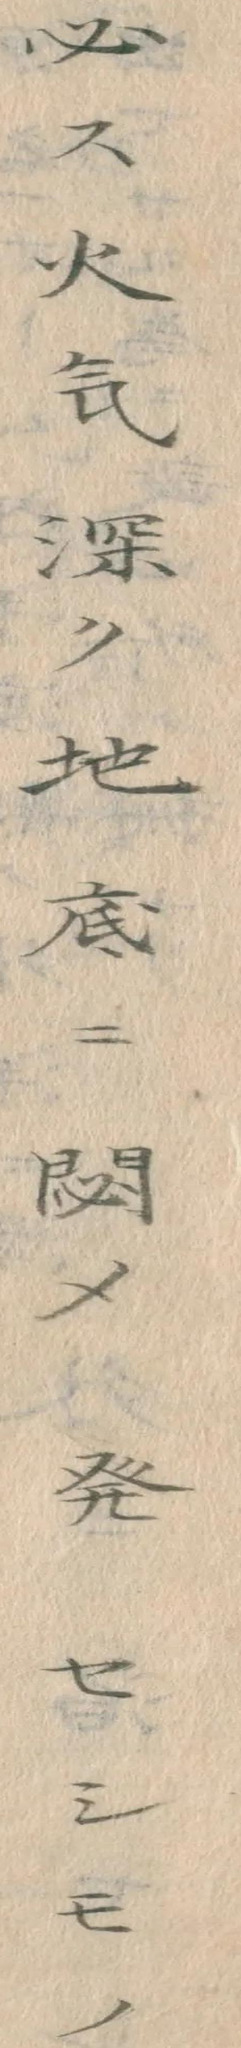必ス火深ク地底ニ悶メ発セシモノ
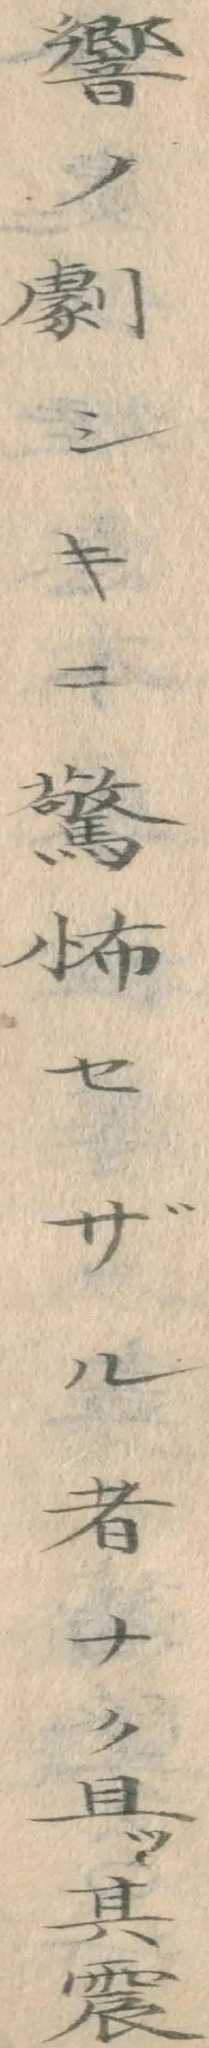響ノ劇シキニ恐怖セザル者ナク且ツ其震

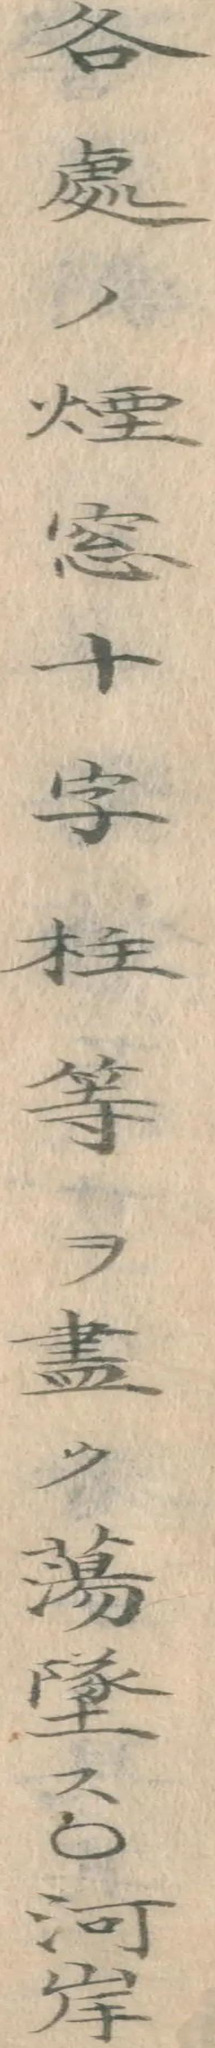各処ノ煙窓十字柱等ヲ尽ク蕩墜ス○河岸
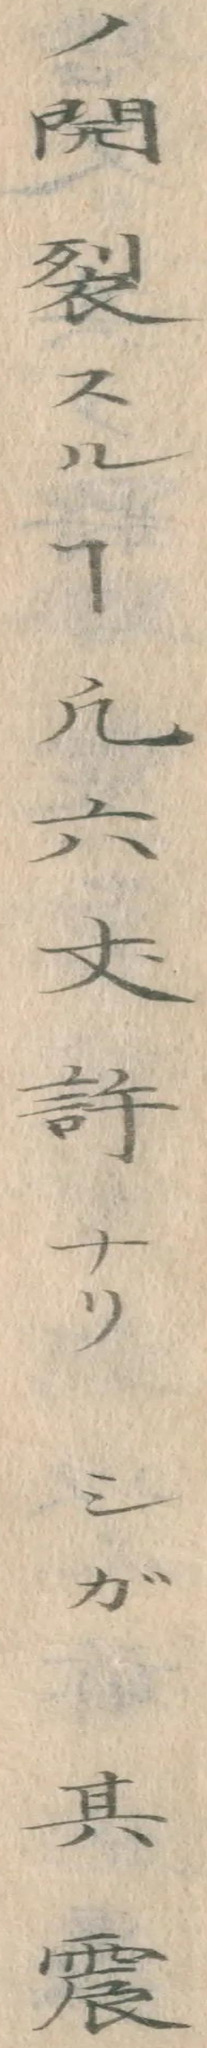ノ開裂スル事凡六丈許ナリシガ其震
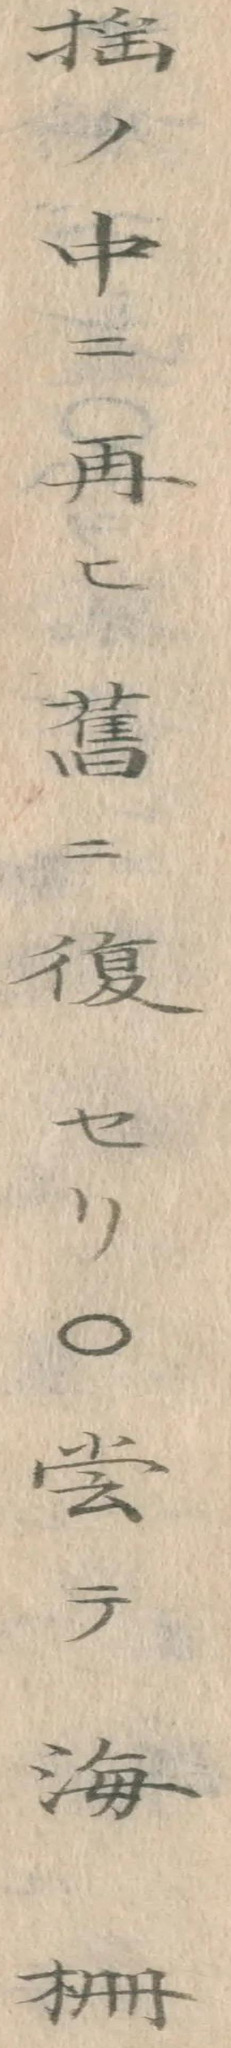揺ノ中ニ再ヒ旧ニ復セリ○テ海柵
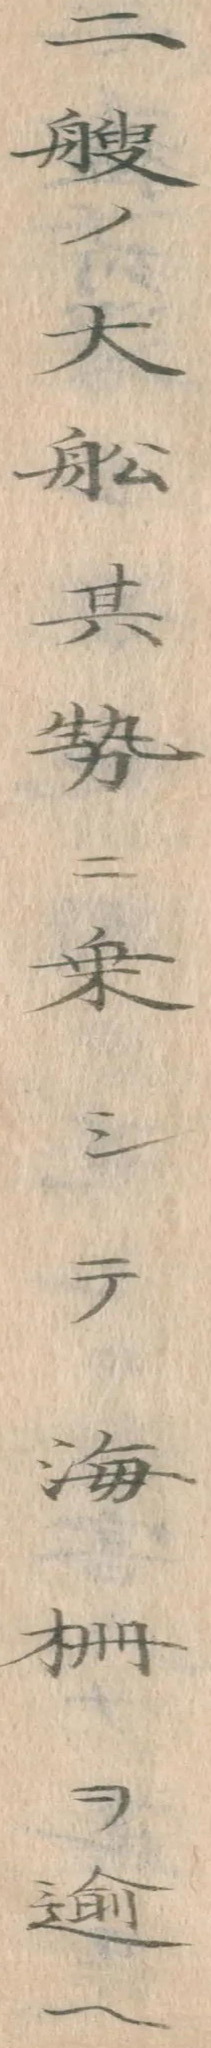二艘ノ大船其勢ニ乗シテ海柵ヲ逾へ
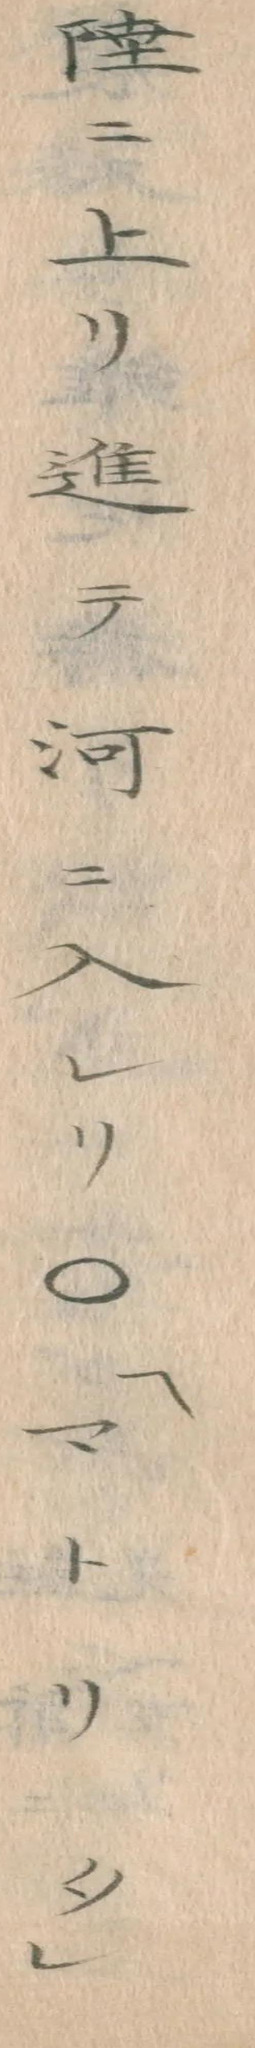陸ニ上リ進テ河ニ入レリ○「マトリタ」
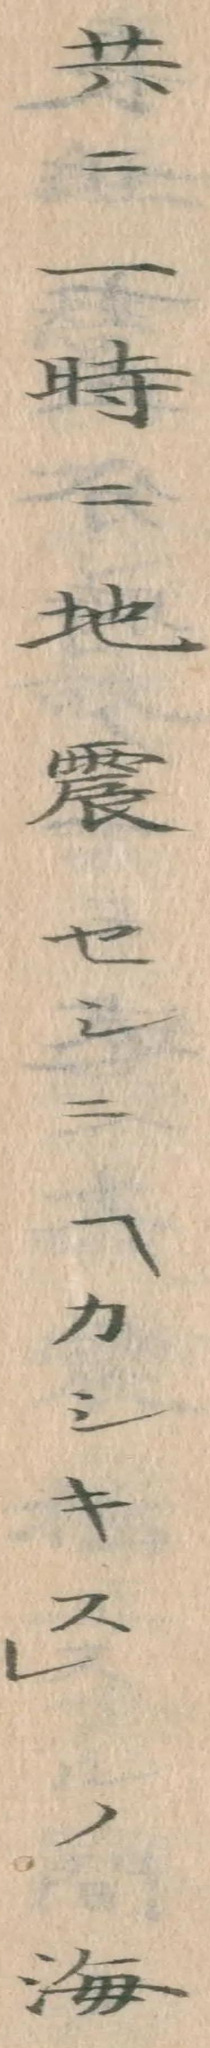共ニ一時ニ地震セシニ「カシキス」ノ海
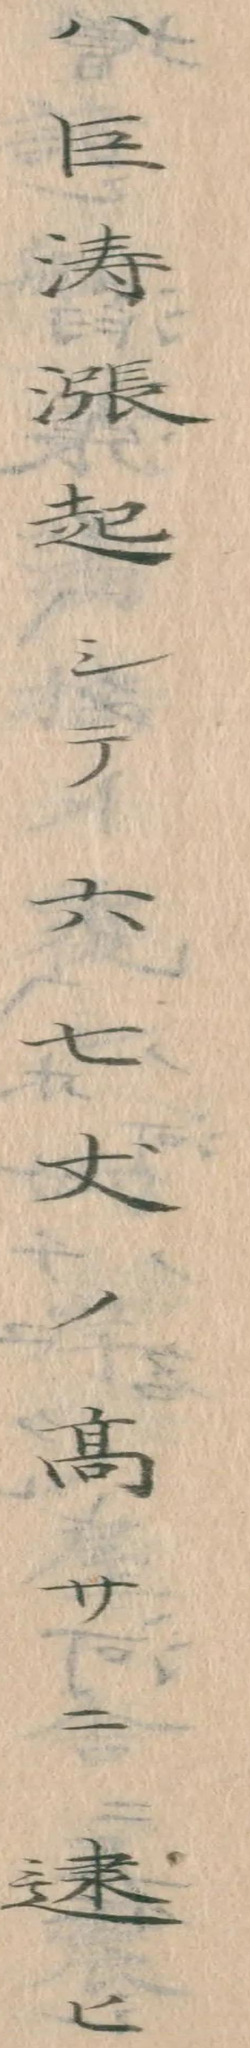ハ巨涛漲起シテ六七丈ノ髙サニ逮ヒ
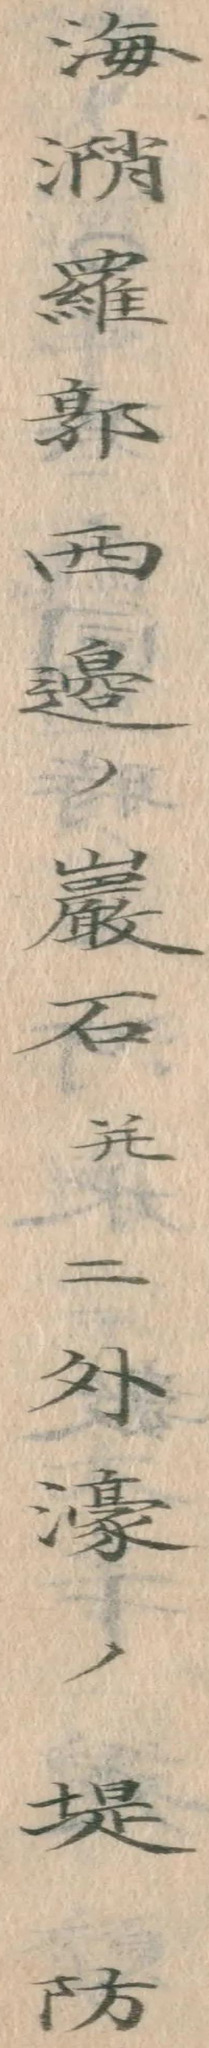海羅郭西辺ノ巌石并ニ外濠ノ堤防
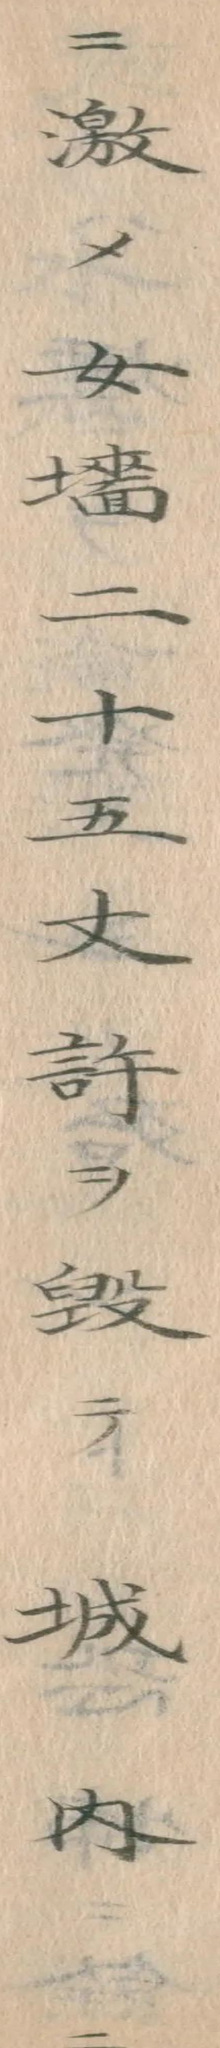ニ激メ女二十五丈許ヲ毀テ城内ニ
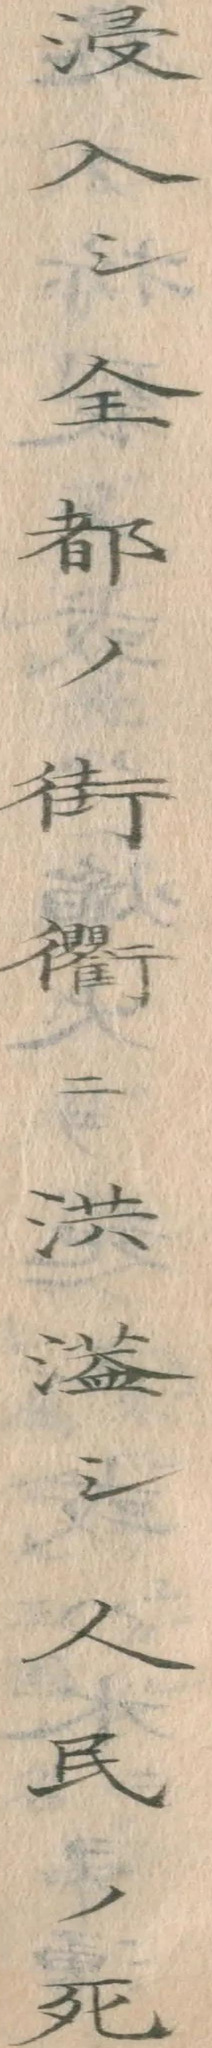侵入シ全都ノ街衢ニ洪シ人民ノ死
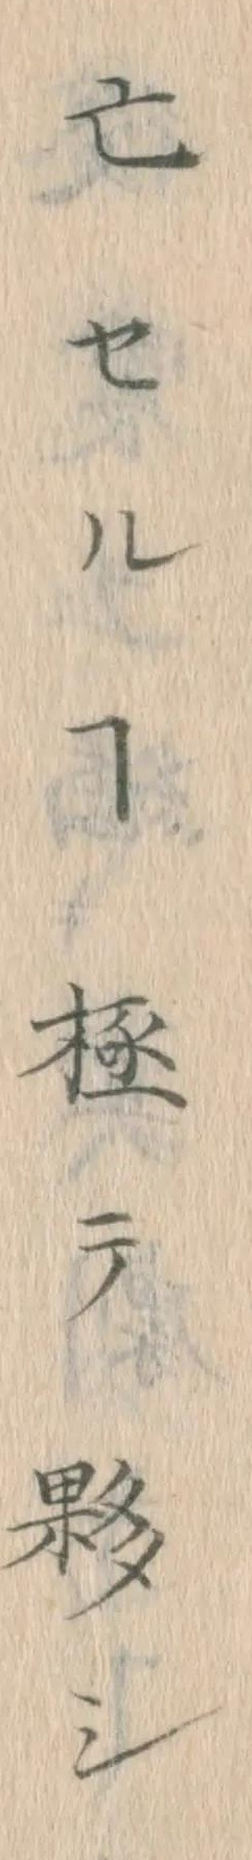亡セル事極テ夥シ
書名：輪池叢書. 12
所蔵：国立国会図書館 National Diet Library, JAPAN
